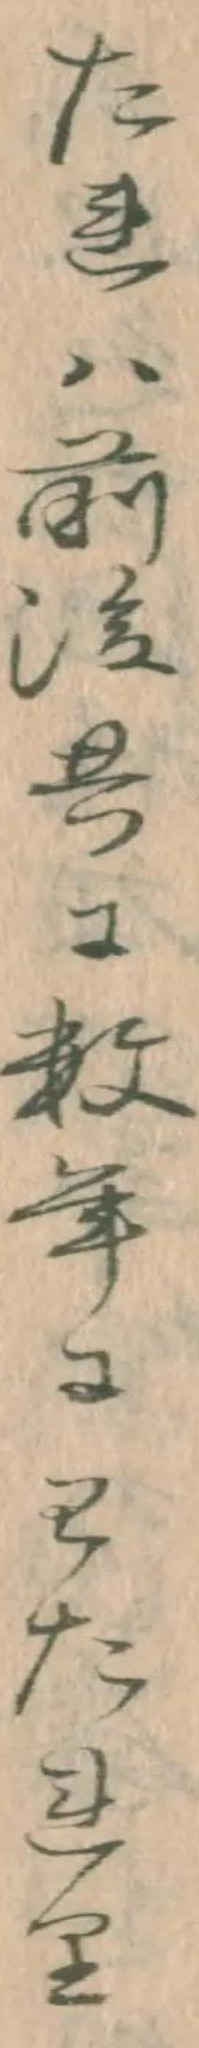たれは前後共に数年にわたれり
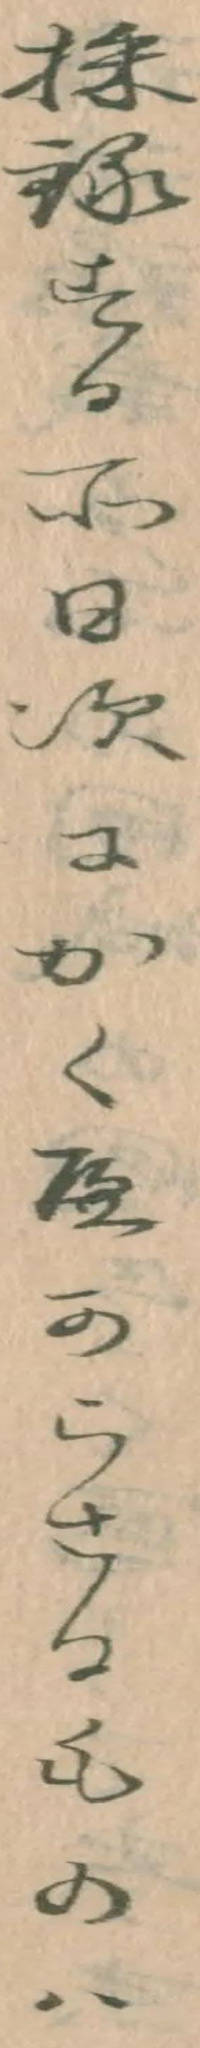一採録する所日次にかくへからさるものは
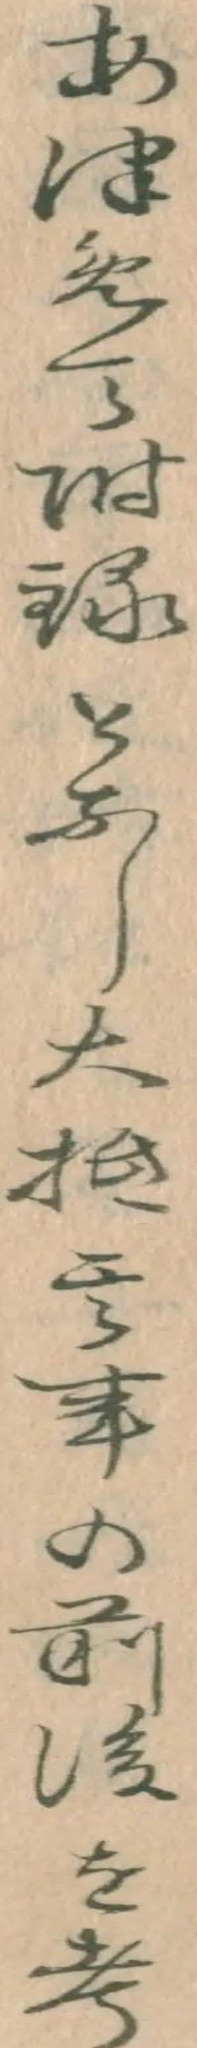あつめて附録となし大抵其事の前後を考
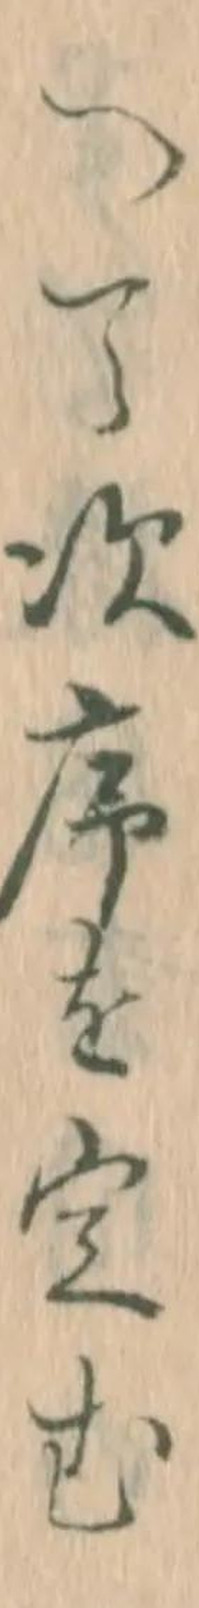へて次序を定む
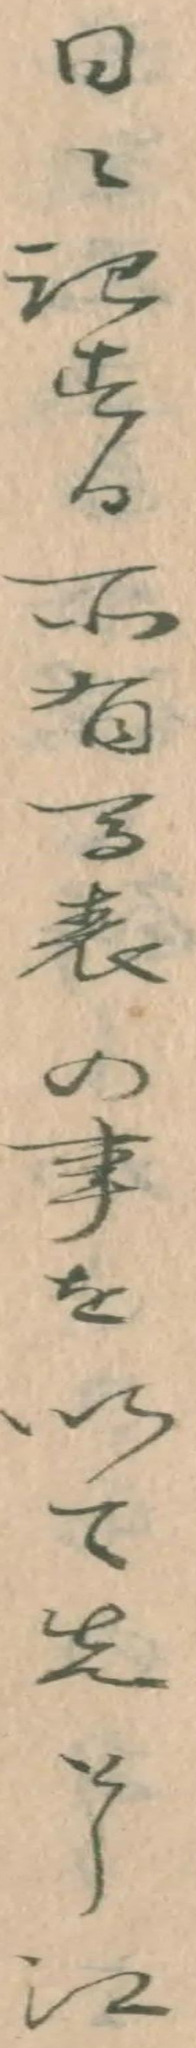一日々記する所有馬表の事を以て先とし江
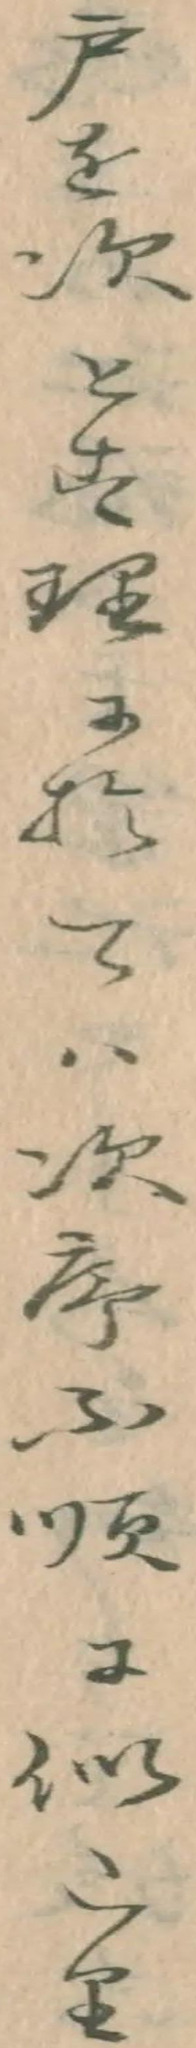戸を次とす理に於ては次序不順に似たり
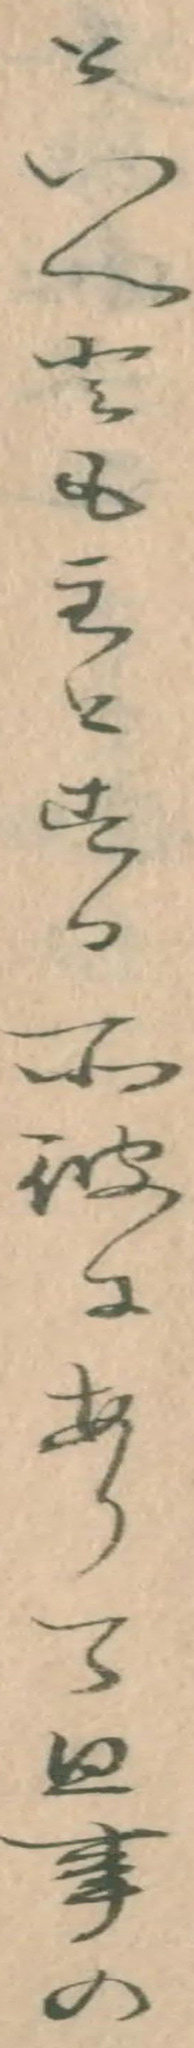といへとも主とする所彼にありて且事の

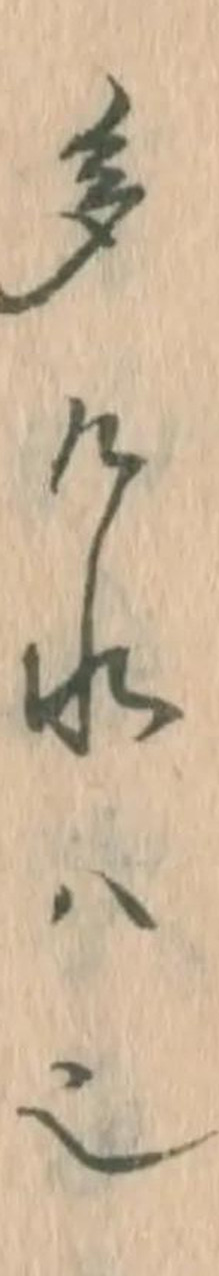多けれは也
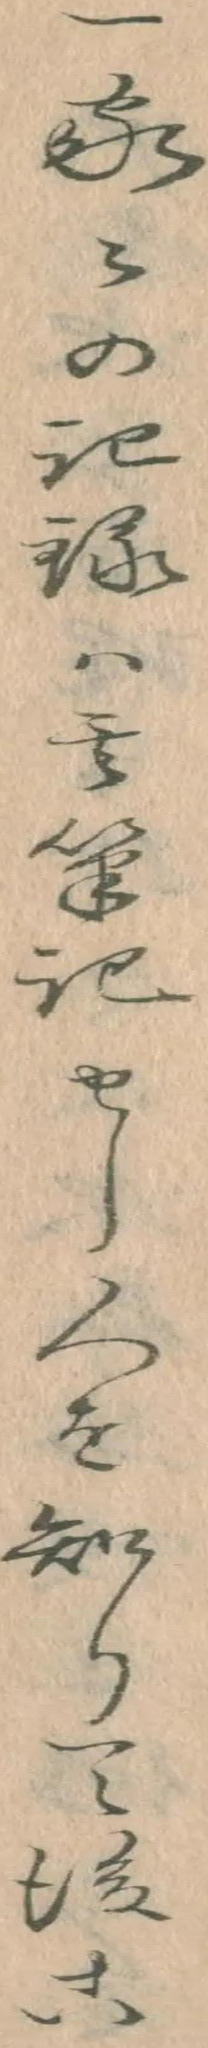一家々の記録は其筆記せし人を知りて後こ
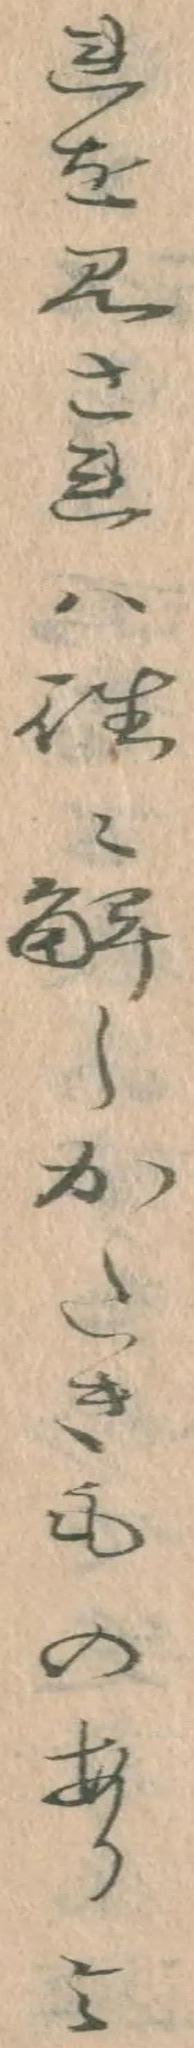れを見されは往々解しかたきものありよ
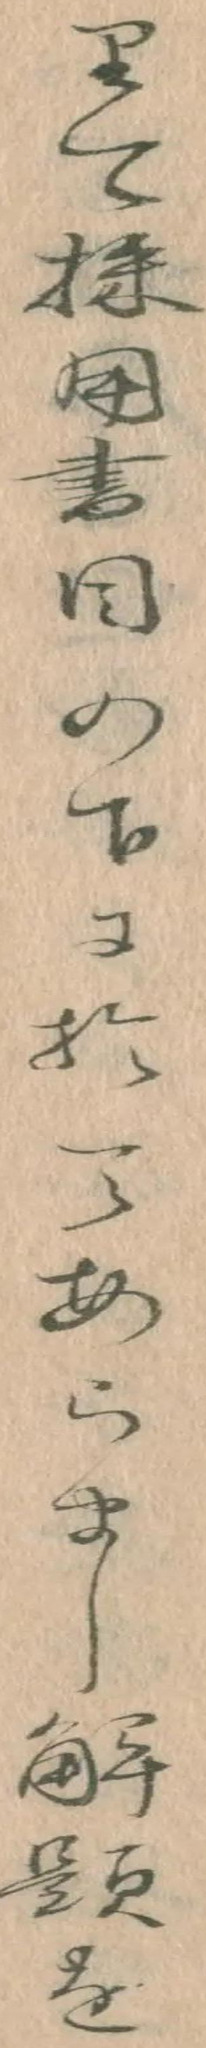りて採用書目の下に於てあらまし解題を
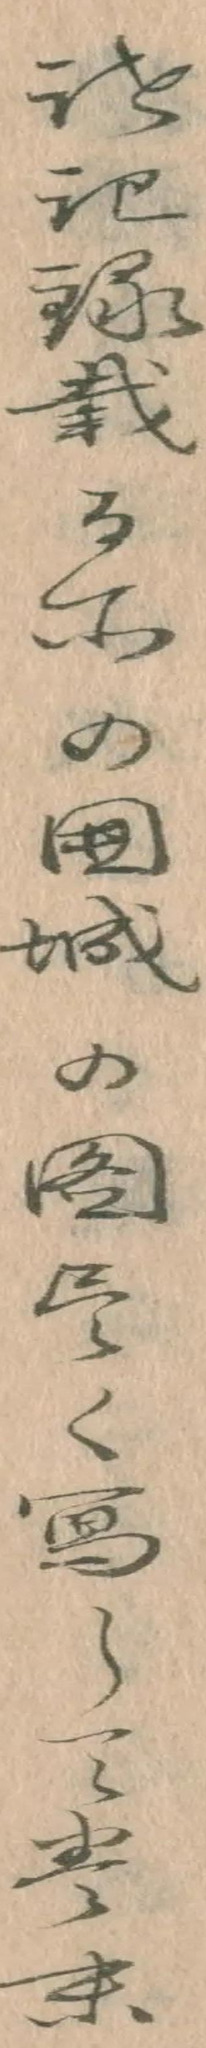一諸記録載る所の囲城の図尽く写して巻末
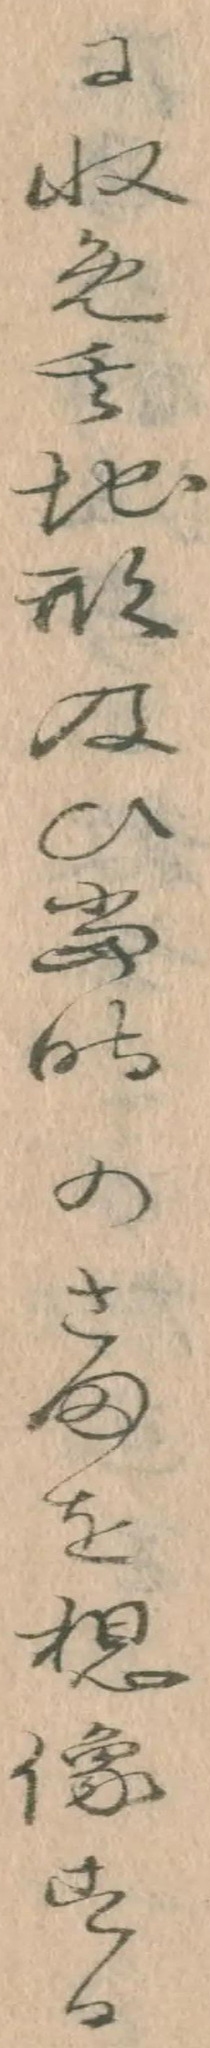に収め其地形及ひ当時のさまを想像する
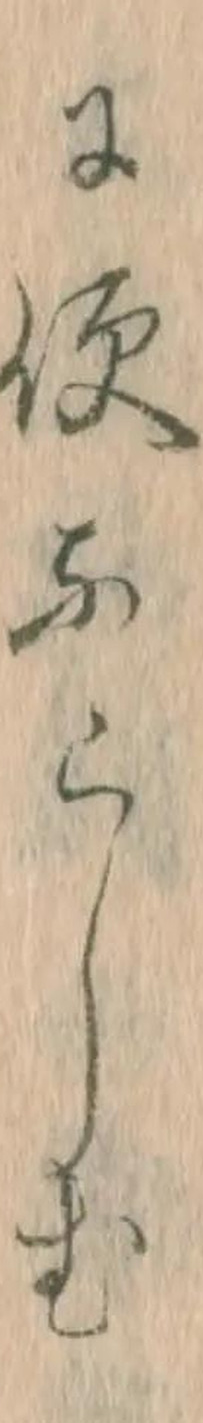に便ならしむ
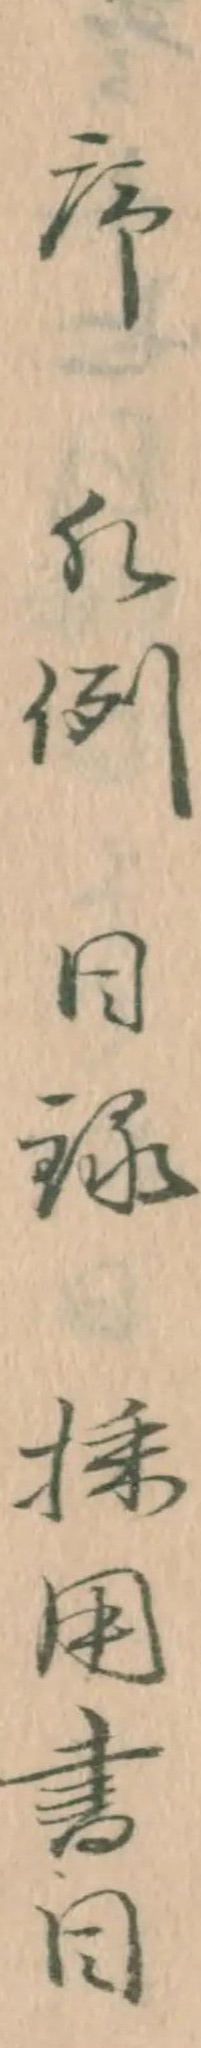序凡例目録採用書目
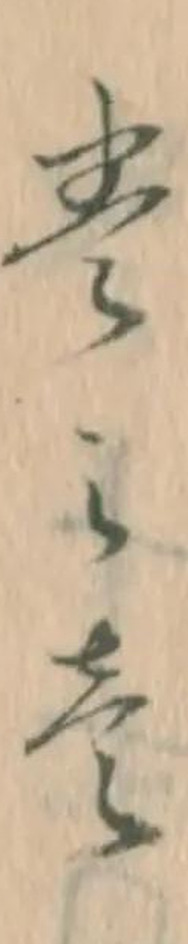巻之壱
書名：切支丹御退治記 49巻. [1]
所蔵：国立国会図書館 National Diet Library, JAPAN
